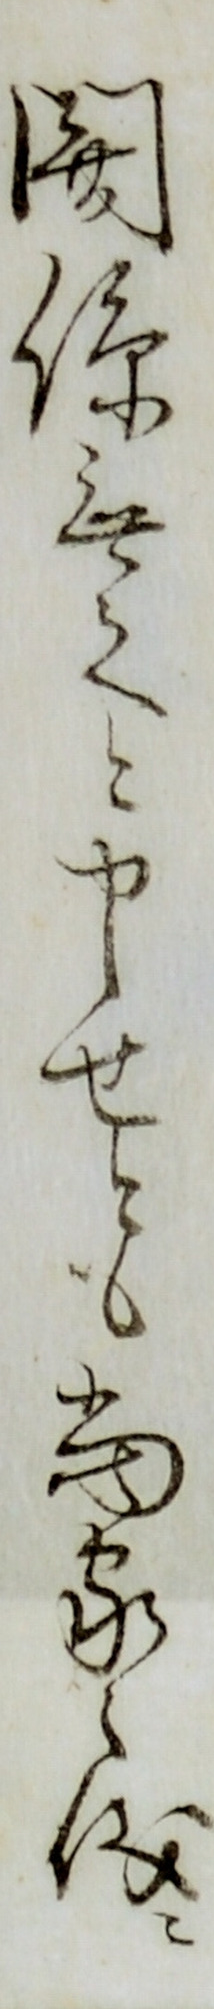関係無之と申せとも当家之儀に

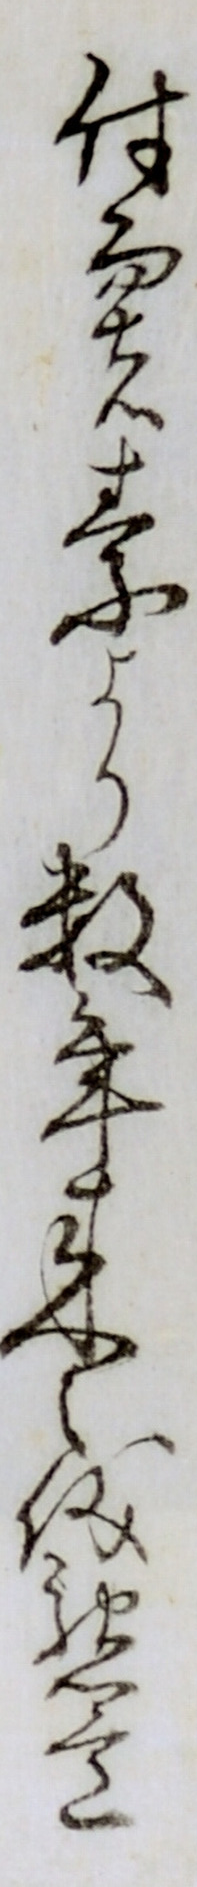付ては素より数年来之儀懇意
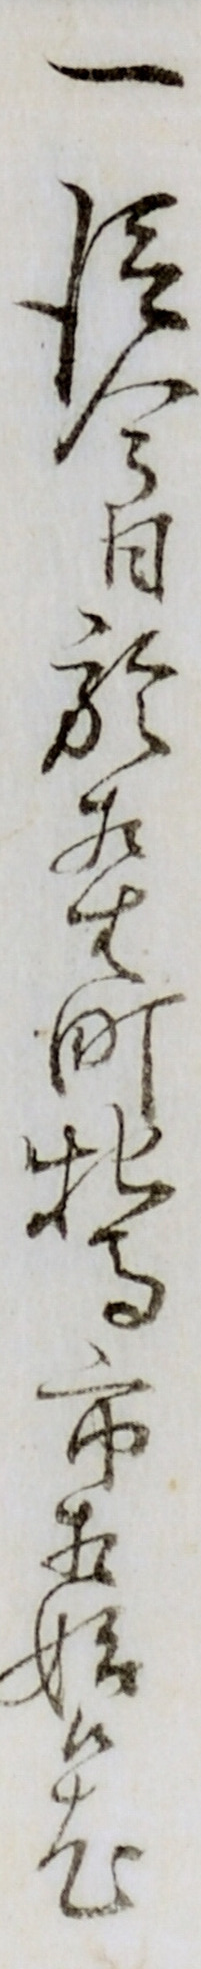一従今日於相生町牝馬市相始候尤
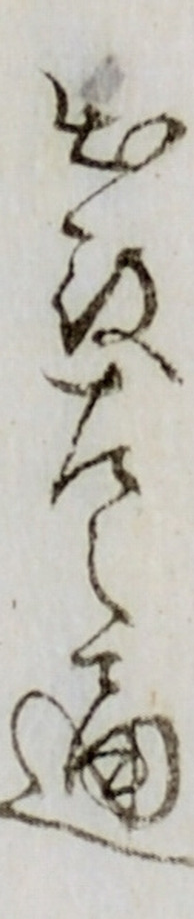出役左之通
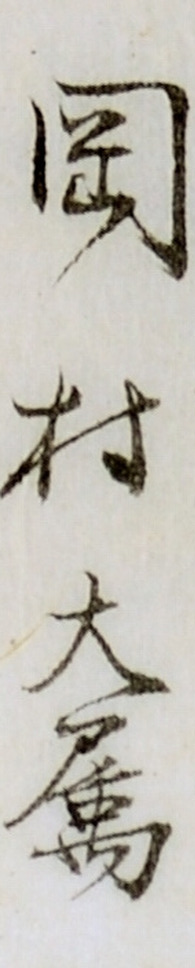岡村大属
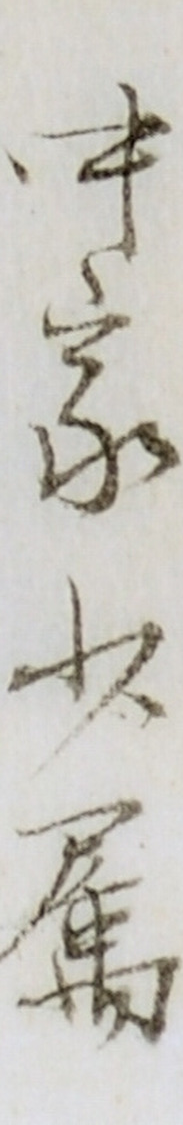中家少属
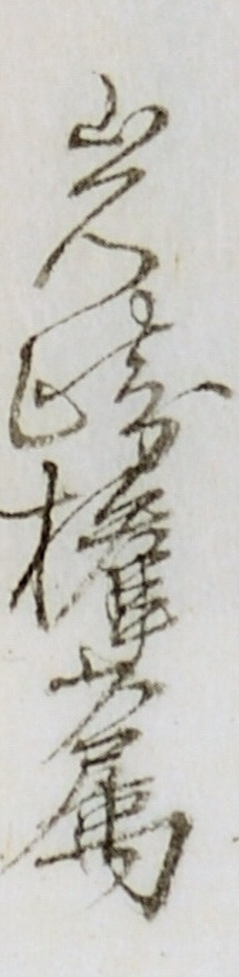岩崎権少属
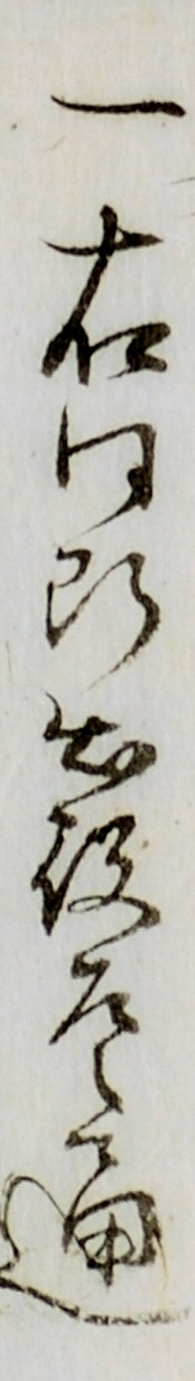一右同断出役左之通
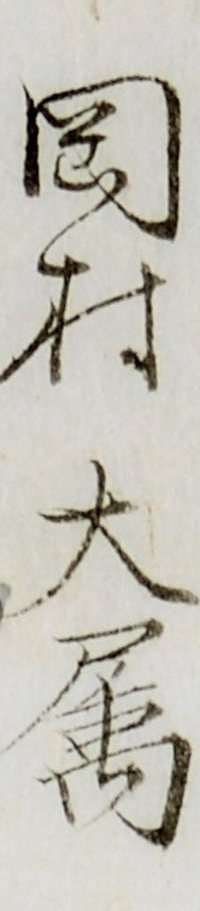岡村大属
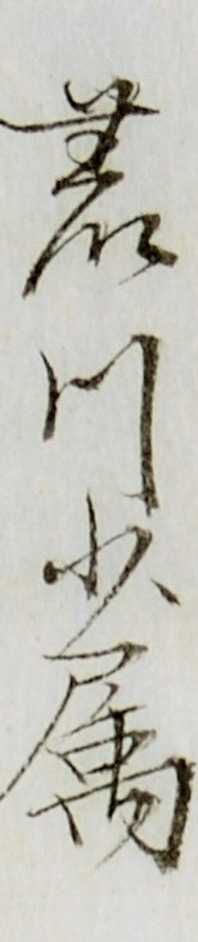荒川少属
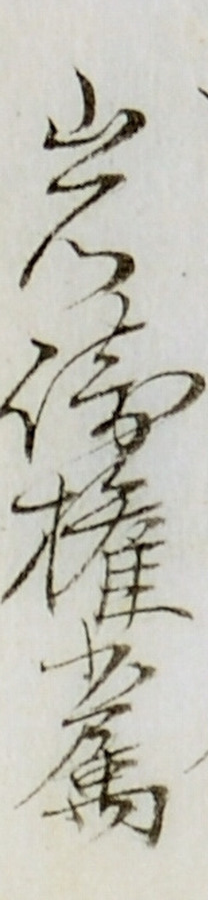岩崎権少属
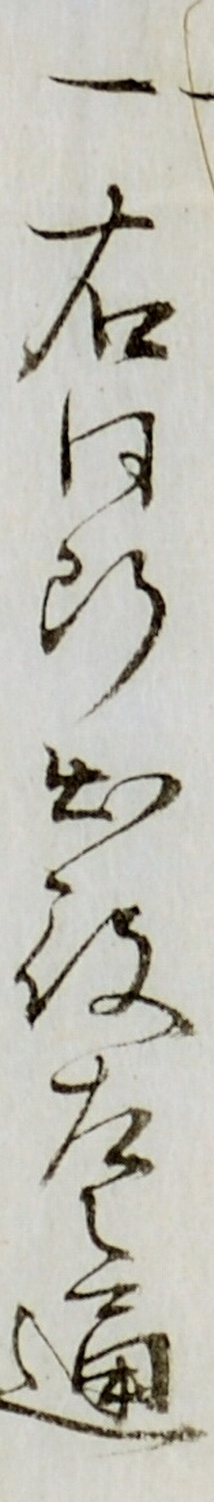一右同断出役左之通
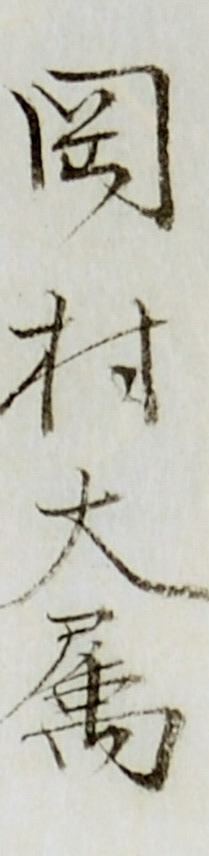岡村大属
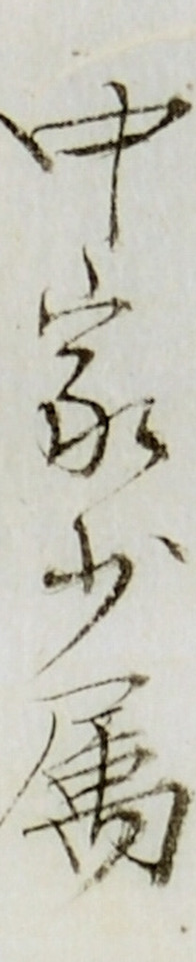中家少属
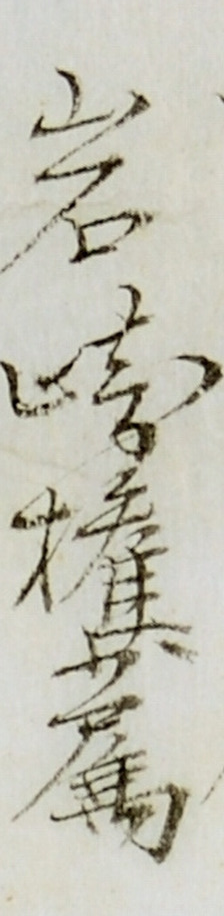岩崎権少属
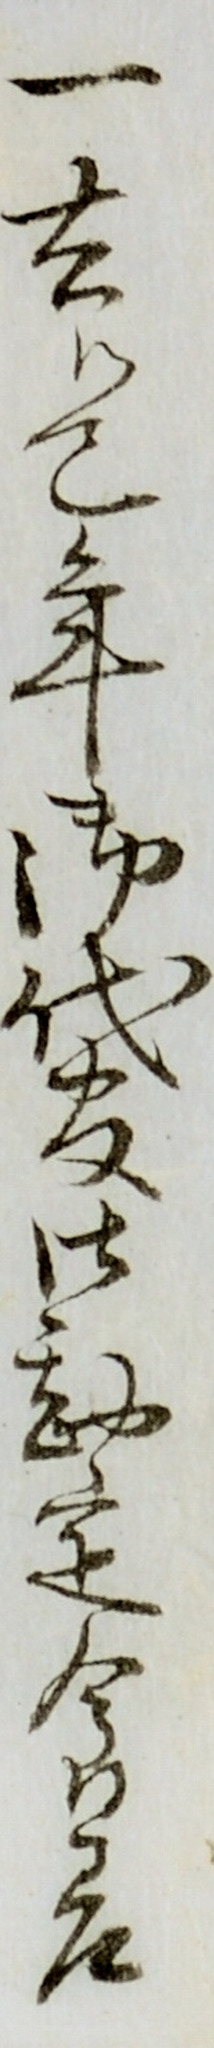一去ル巳年御代官御勘定今日差
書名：山林方諸事御用留
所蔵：伊那市立高遠町図書館・合同会社AMANE
